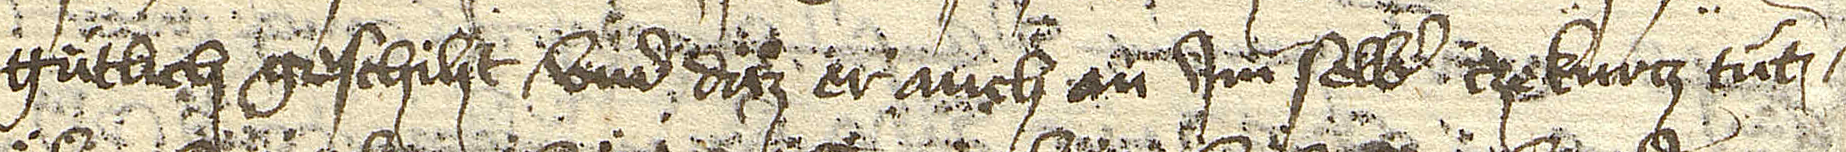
gütlich geſchiht / vnd daʒ er auch an Im ſelb* cʒe kurcʒ tüt /
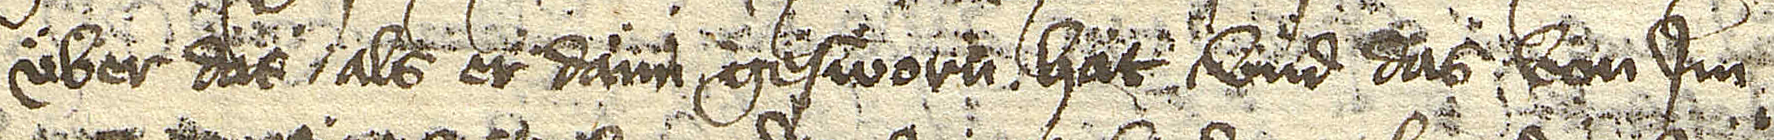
v̈ber das / als er dann geſworn hat / vnd das von Im
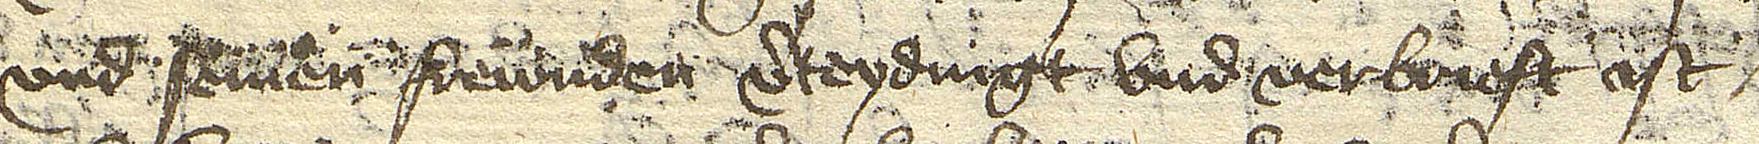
vnd ſeinen frewnden v*teydingt vnd verbrieft iſt / .
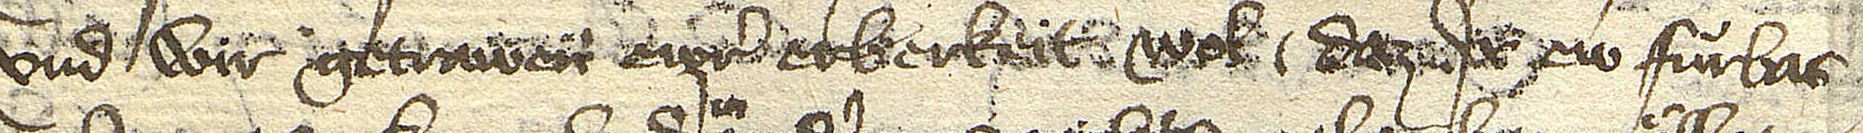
vnd wir getrawen ewr* erberkeit wol / daʒ Ir ew fürbas
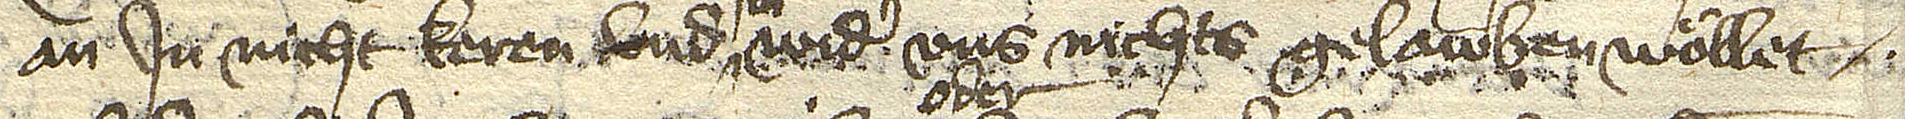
an In nicht keren vnd wid* vns nichts gelawben wöllet / .
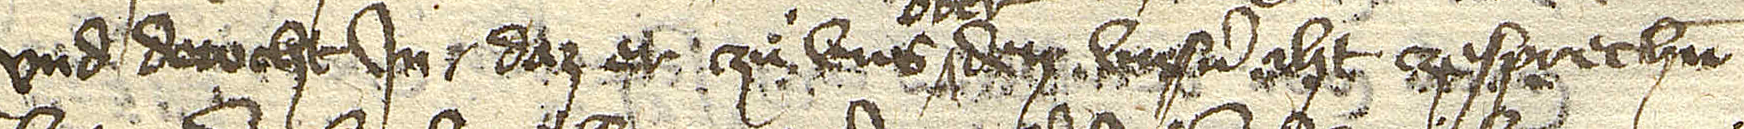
vnd dewcht In / daʒ er cʒü vns den vnſn* iht cʒeſprechn*
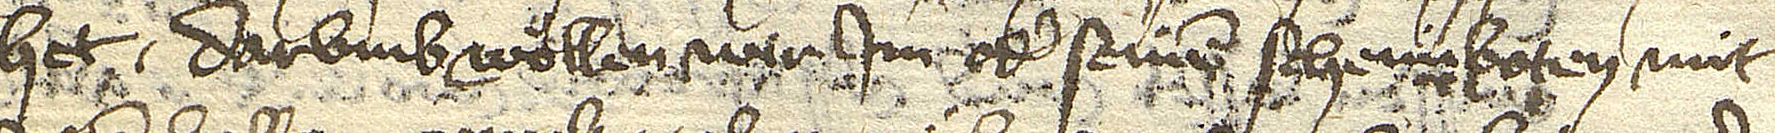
het / Darvmb wöllen wir Im od* ſeine* ſcheimboten mit
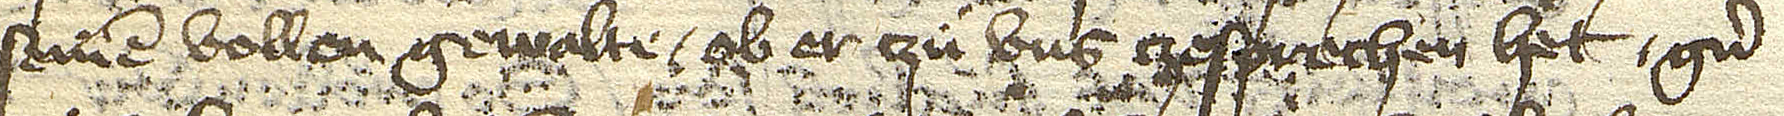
ſeine* vollen gewalte / ob er cʒü vns cʒeſprechen het / gn*
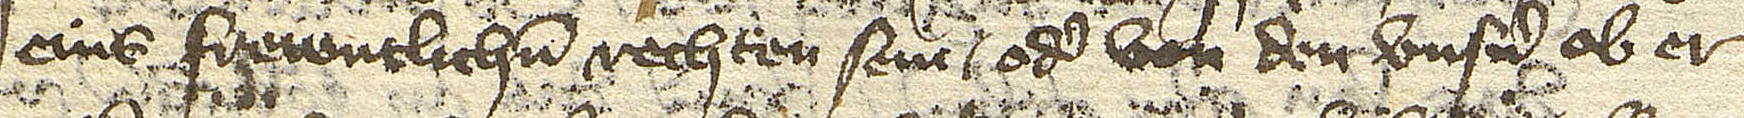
eins frewntlichn* rechten ſein / od* von den vnſn* ob er
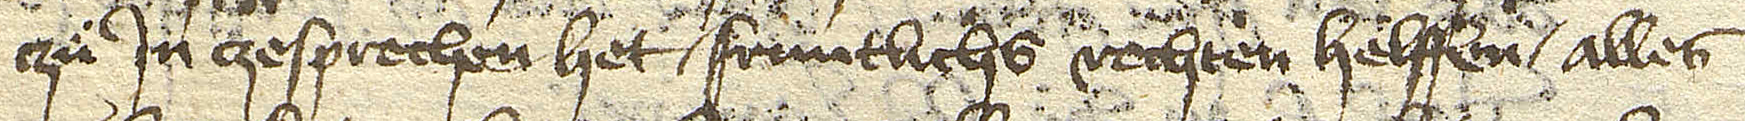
cʒü In cʒeſprechen het / fruntlichs rechten helffen / alles
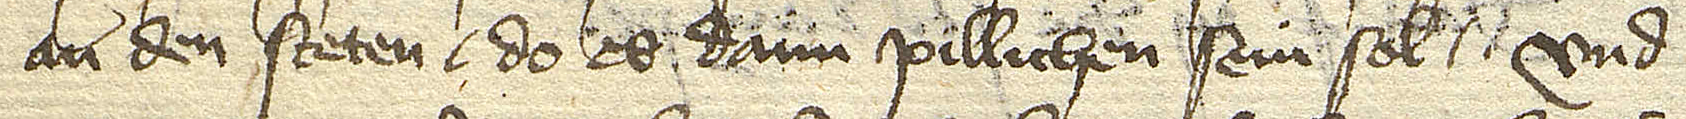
an den ſteten / do es dann pillichen ſein ſol / vnd
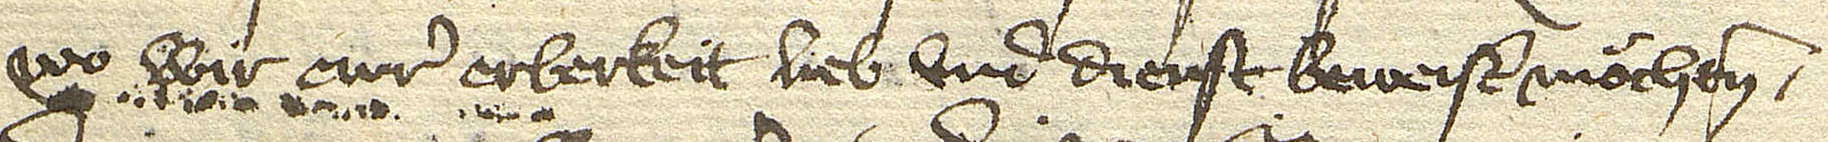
wo wir ewr* erberkeit lieb vnd dienſt beweiſe* möchtn* /
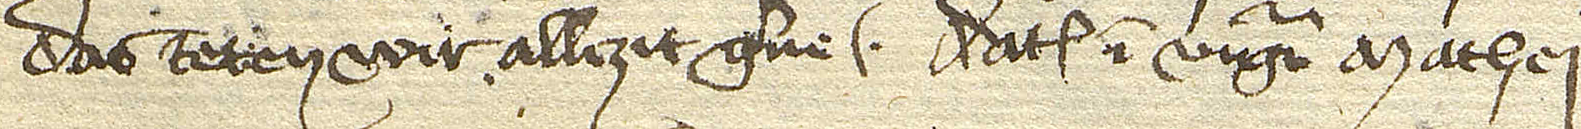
Das teten wir allcʒit g*ne / . Dat* i* vigi* Mathei
